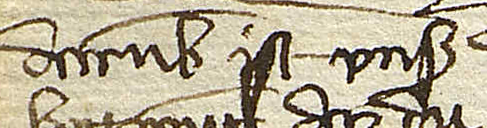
darub* iſt vnſ*
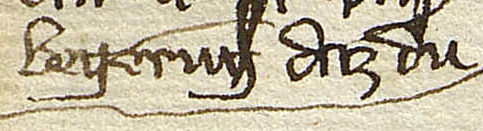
begeru*g daʒ du
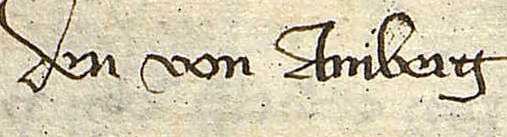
den vom Amberg
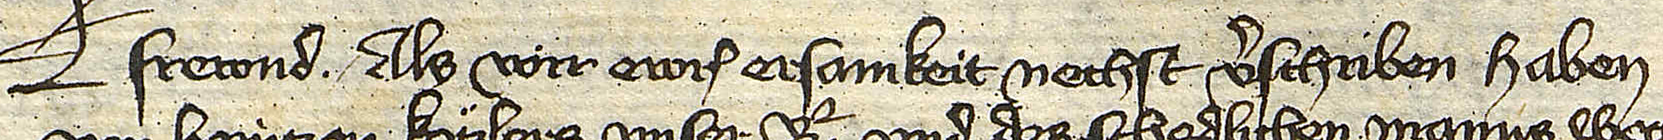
L* frewnd . / Als wir ewr* erſamkeit nechſt v*ſchriben haben
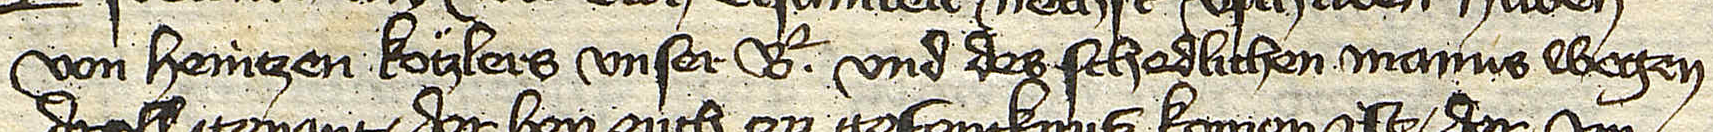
von heincʒen Köcʒlers vnſer B* . vnd des ſchedlichen manns wegen
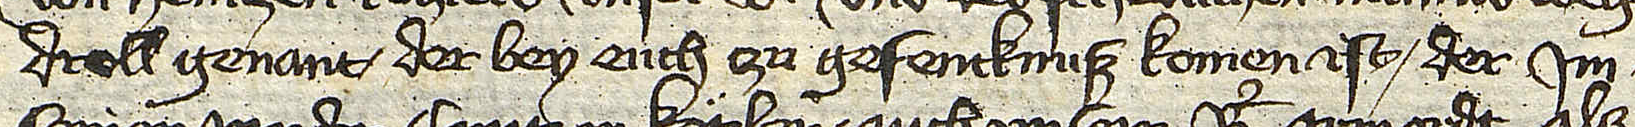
Droll genant / der bey euch cʒu gefencknuſʒ komen iſt / der Im
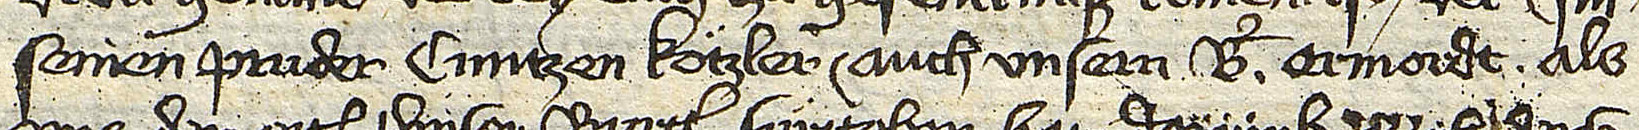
ſeinen pruder Cuntʒen Köcʒler / auch vnſern B* . ermordt . als
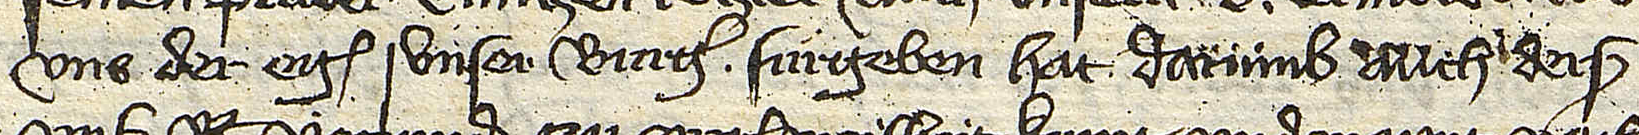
vns der eg* / vnſer Burg* . fürgeben hat darümb auch derſ*
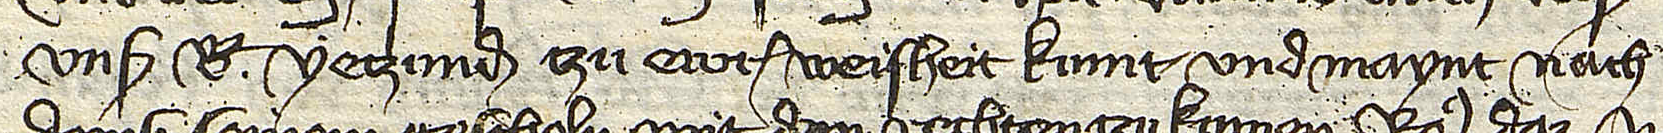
vnſ* B* yecʒund* cʒu ewr* weiſheit kumt vnd maynt nach
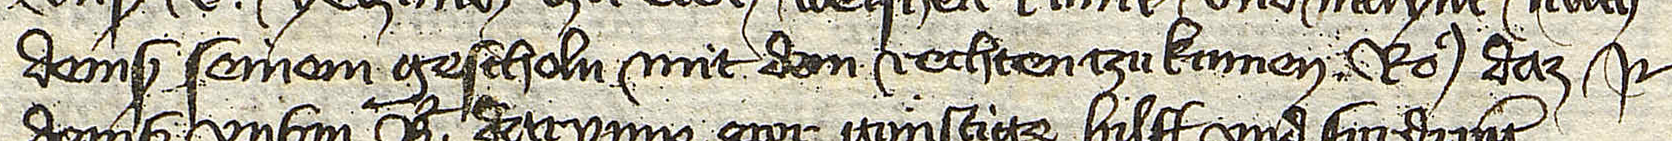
demſ* ſeinem geſcholn mit dem rechten cʒu kummen . Ro* daʒ Ir
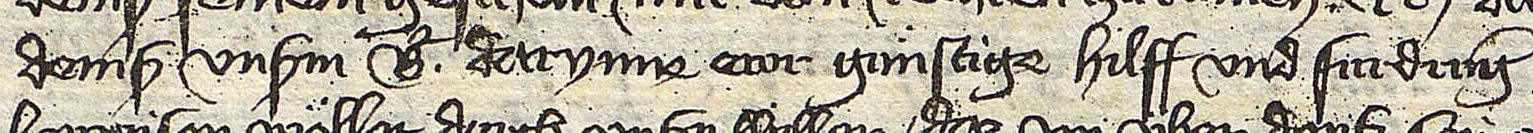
demſ* vnſ*m B* . darynne ewr günſtige hilff vnd furdru*g*
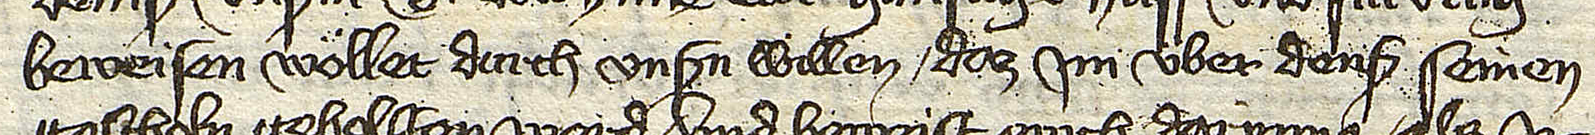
beweiſen wöllet durch vnſ*n willen / daʒ Im v̈ber denſ* ſeinen
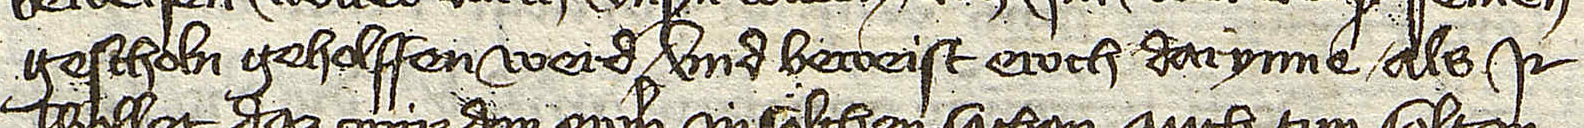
geſcholn geholffen werd / Vnd beweiſt ewch darynne / als Ir
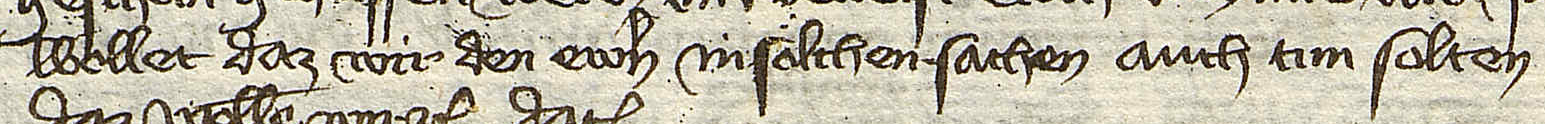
wellet daʒ wir den ew*n in ſölchen ſachen auch tun ſolten
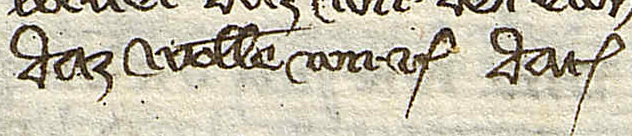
daʒ wolle* wir ec* dat*
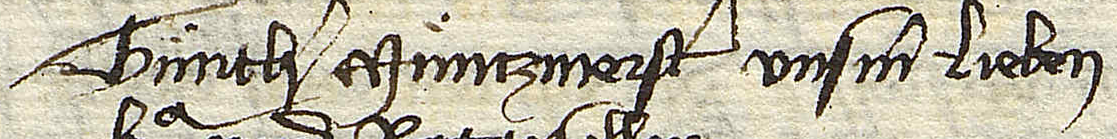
Günth* Müncʒmeiſt* vnſ*m lieben
